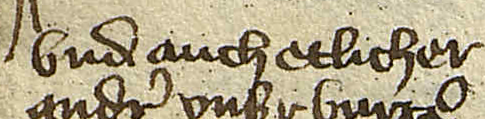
vnd auch etlicher
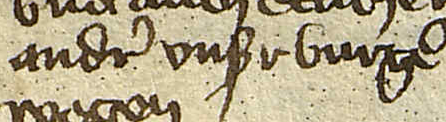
andr* vnſ*r burge*
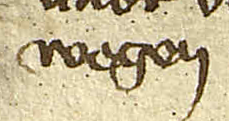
wegen
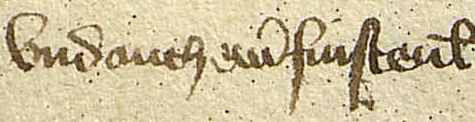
vnd auch ew* fürſtenl*
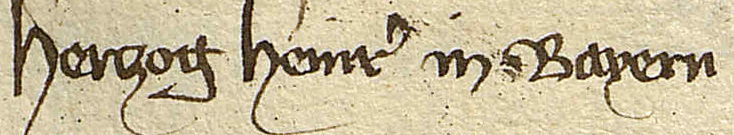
hercʒog heinr* in Bayern
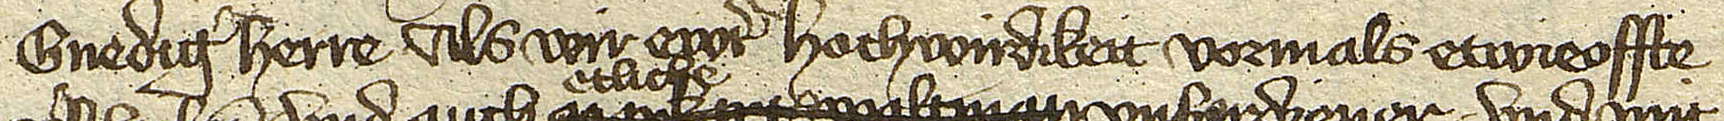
Gnedig* herre Als wir ewr* hochwirdikeit vormals etwieoffte
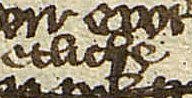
etliche
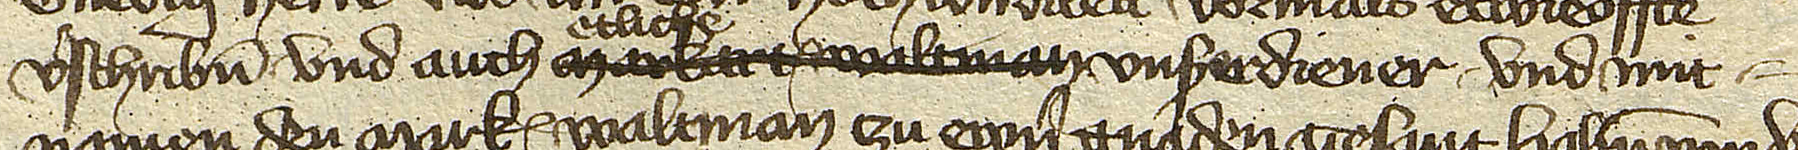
v*ſchribn* / vnd auch Markart* waltman vnſ*er diener / vnd mit =
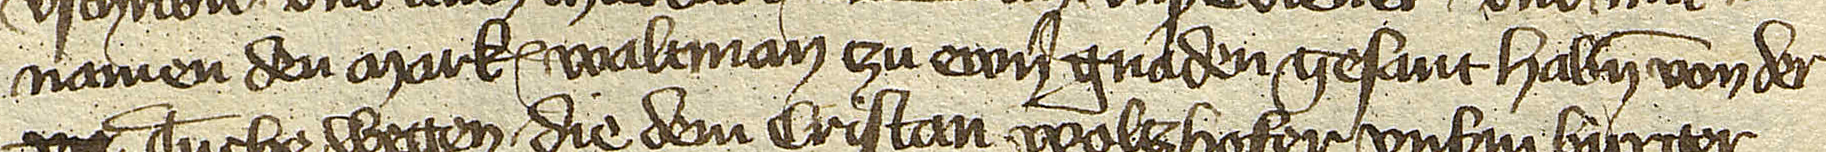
namen den Mark* waltman cʒu ewn* gnaden geſant habn* von der
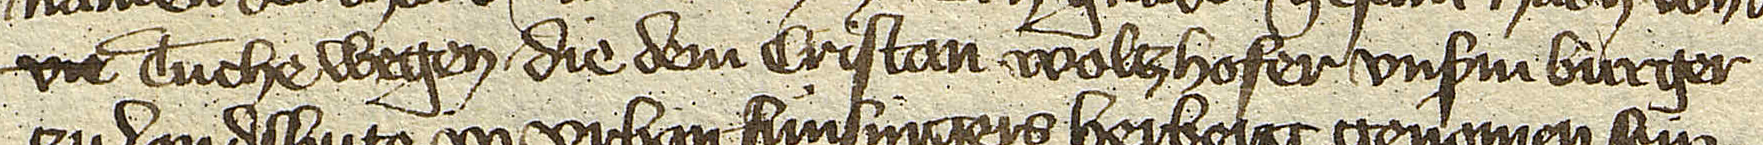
vn Tuche wegen / die dem Criſtan wolcʒhofer vnſ*m burger
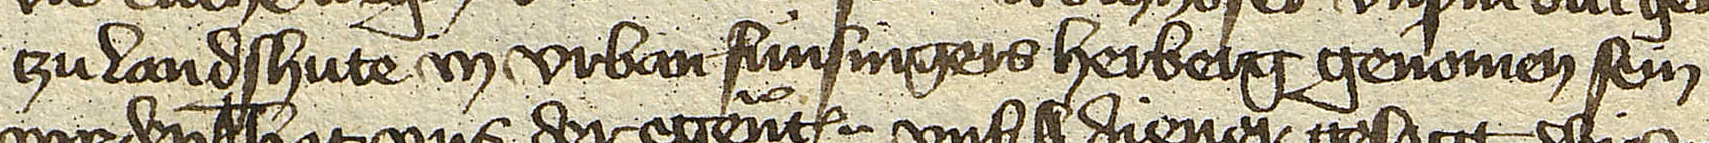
cʒu landſhute in vrban fünſingers herberg genomen ſein
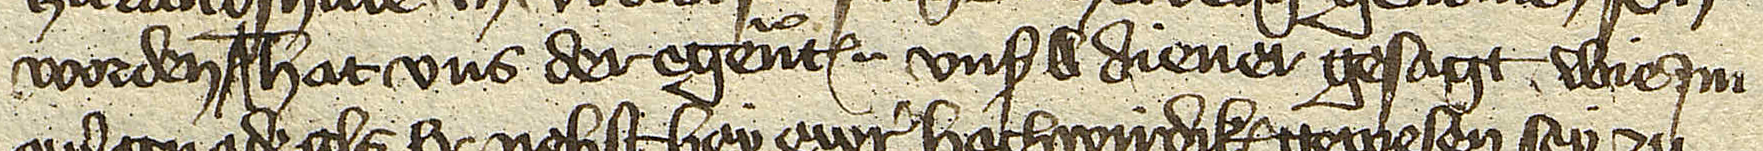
worden hat vns der egent* ~ vnſ* b diener geſagt / wie Im
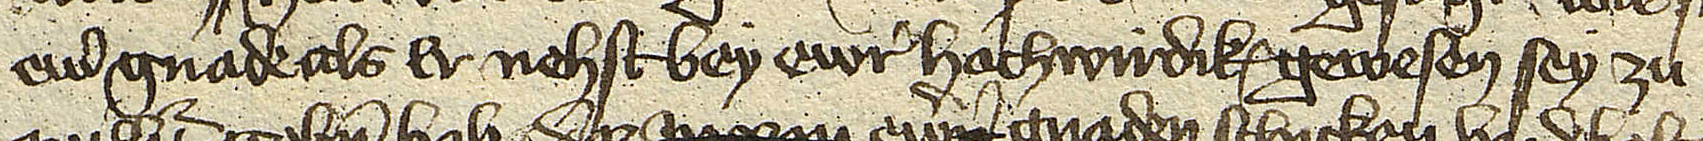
ew* gnade als Er nehſt bey ewr* hochwirdik* geweſen ſey cʒu
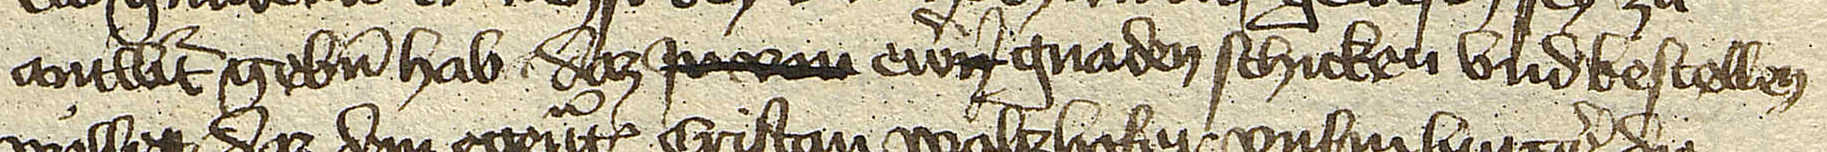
antw*t gebn* hab / daʒ Ir von ewn* gnaden ſchicken vnd beſtellen
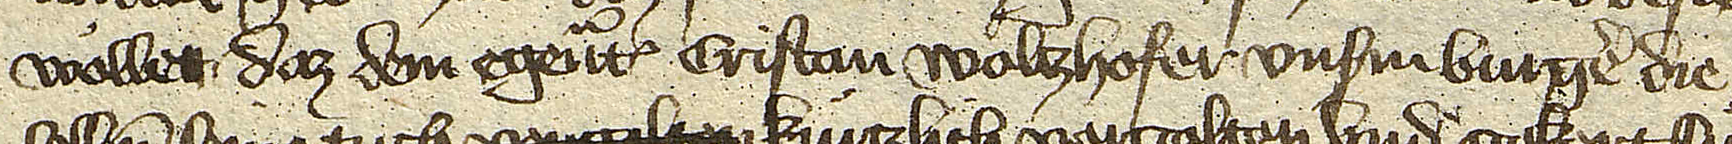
wöllet / daʒ dem egent* Criſtan wolcʒhofer vnſ*m burge* die
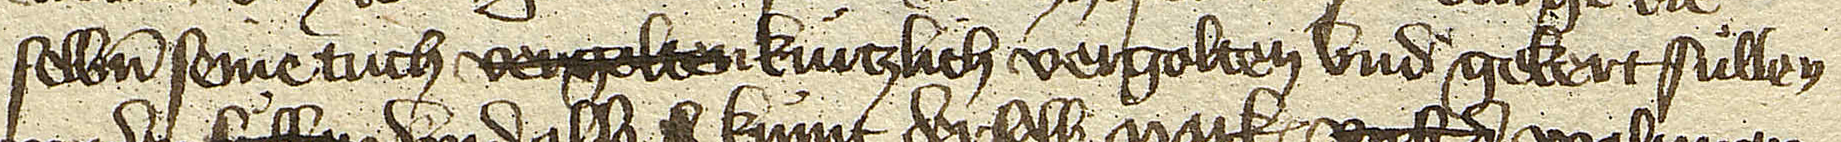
ſelbn* ſeine tuch vergolten kürcʒlich vergolten vnd gekert ſüllen
